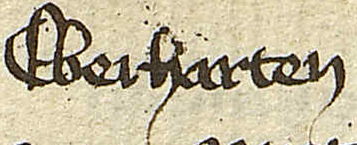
Eberharten
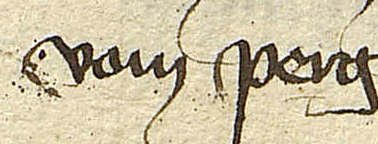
vom Perg
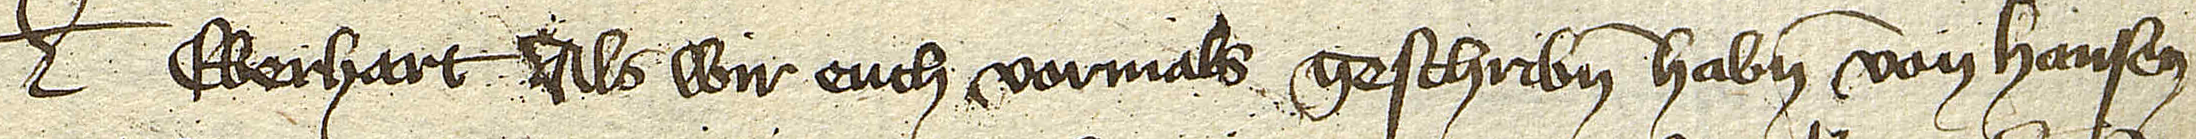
L* Eberhart Als wir euch vormals geſchribn* habn* von hanſen
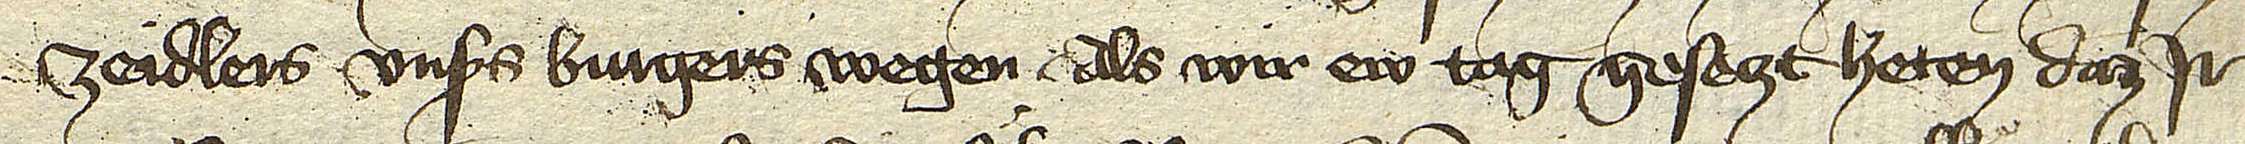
cʒeidlers vnſ*s burgers wegen / Als wir ew tag geſecʒt heten daʒ Ir
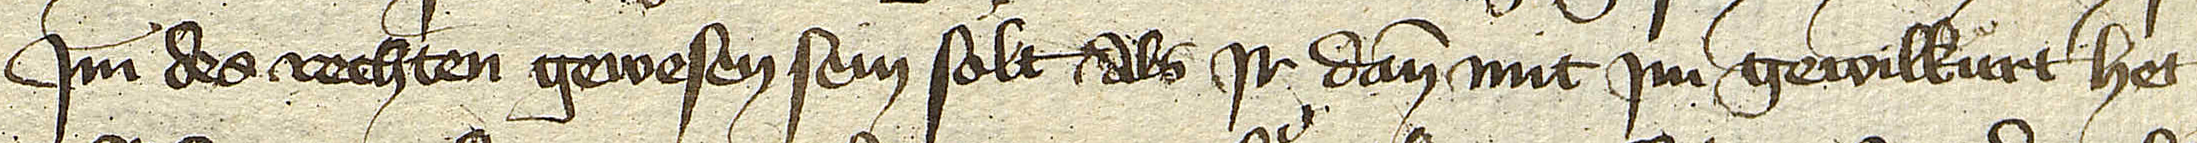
Im des rechten geweſen ſein ſölt / Als Ir dan* mit Im gewilkürt het
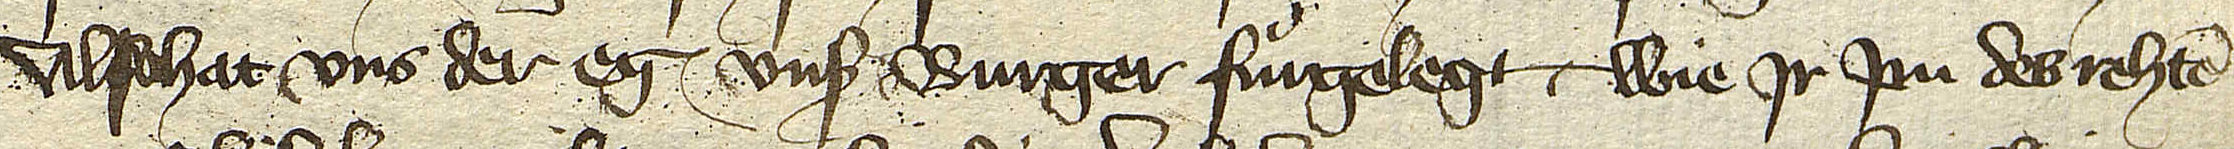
Alſo hat vns der eg* vnſ* Burger fürgelegt / wie Ir Im des rehte*
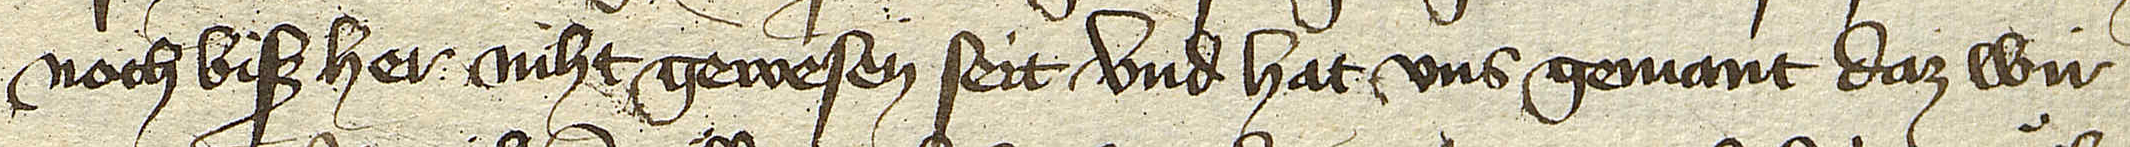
noch biſʒ* her niht geweſen ſeit / Vnd hat vns gemant daʒ wir
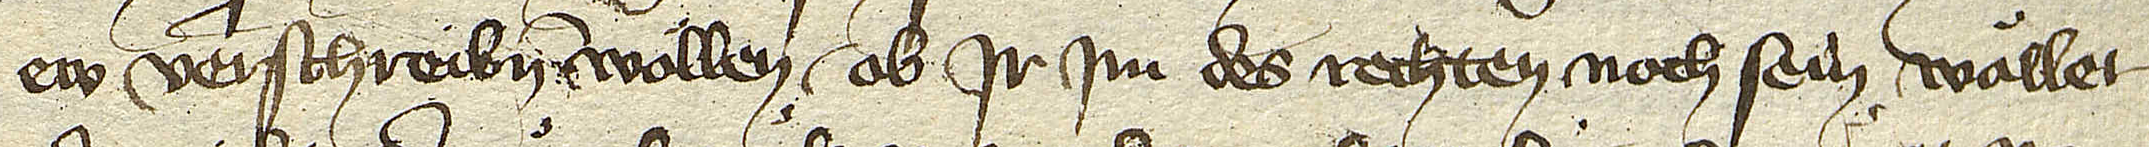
ew verſchreibn* wöllen / ob Ir Im des rechten noch ſein wöllet
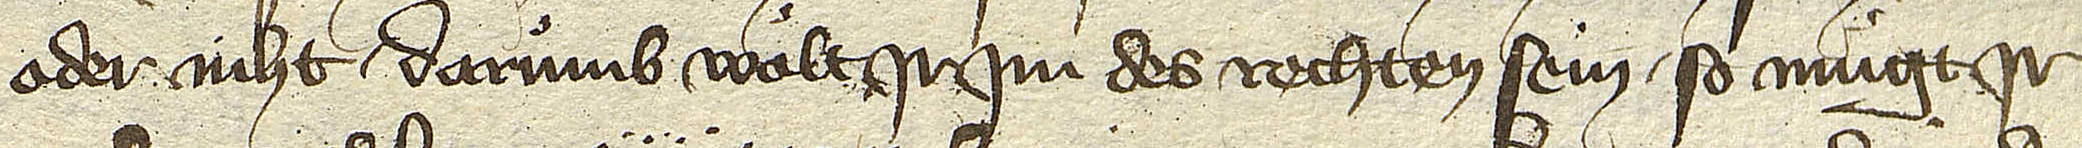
oder niht / darümb wölt Ir Im des rechten ſein / ſo mügt Ir
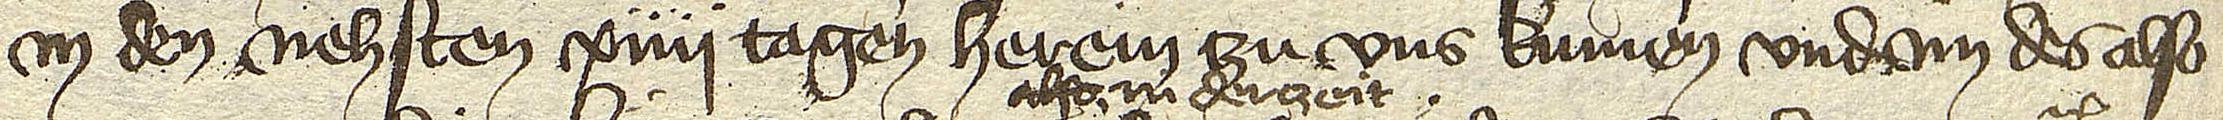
in den nehſten xiiii tagen herein cʒu vns kumen vnd im des alſo
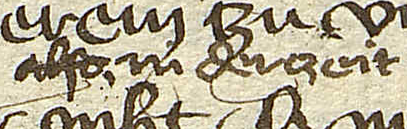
alſo in der cʒeit
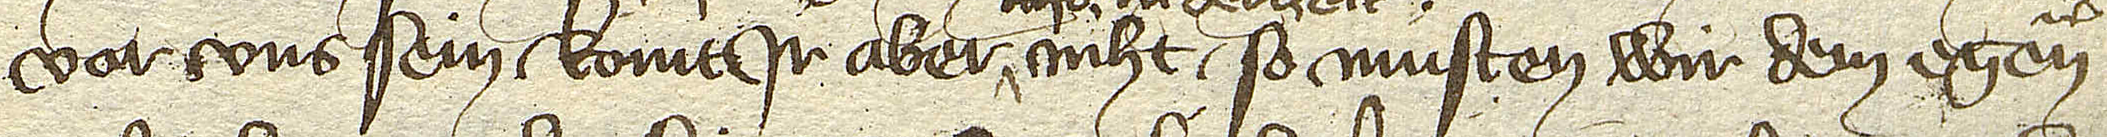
vor vns ſein / kömt Ir aber niht / ſo müſten wir dem egen*
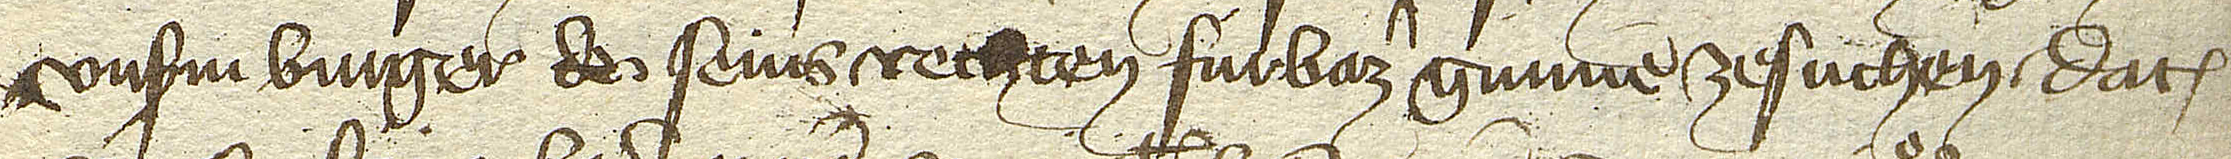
vnſ*m burger de ſeins rechten fürbaʒ günne* cʒeſuchen / dat*
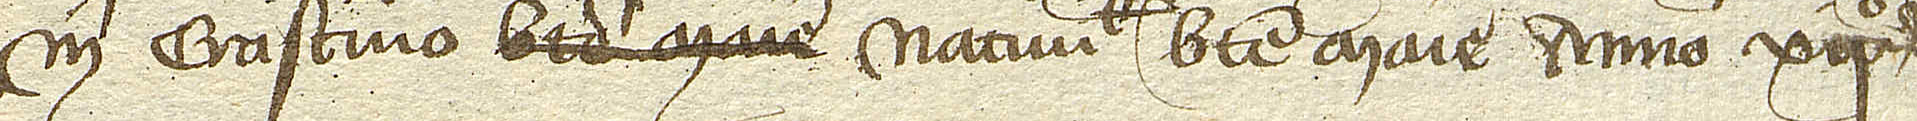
in Craſtino bte* Maie* Natiui* bte* Maie* Anno xii* §
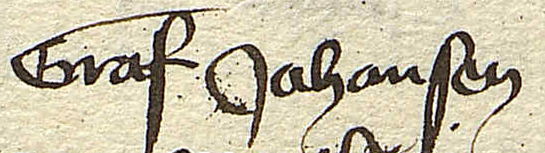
Graf Iohanſen
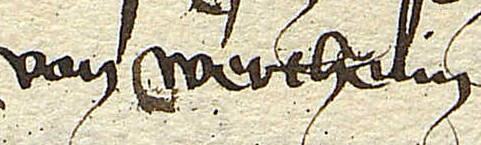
von wertheim
